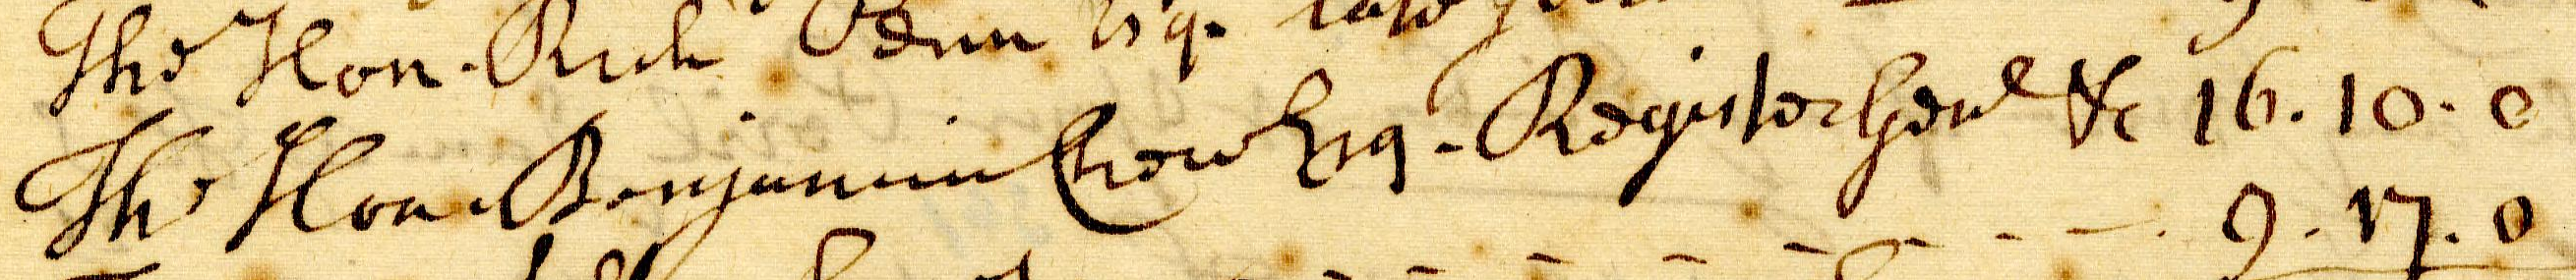The Hon. Benjamin Chew Esq- Register Gen^l &c 16.10.0
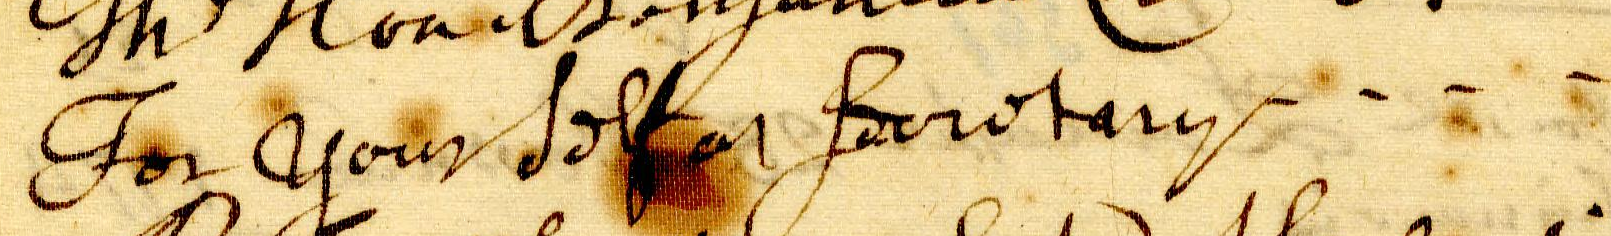For your Self or Secretary
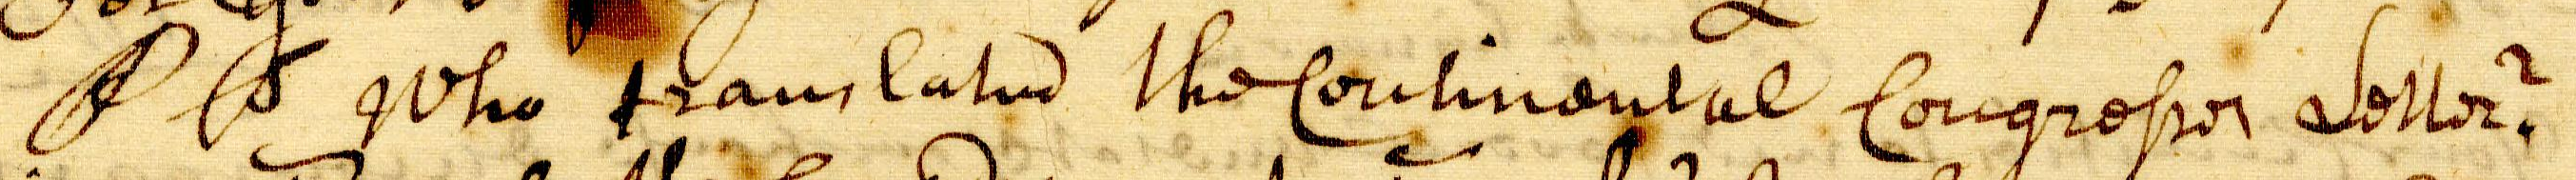PS Who translated the Continental Congresses Letter?
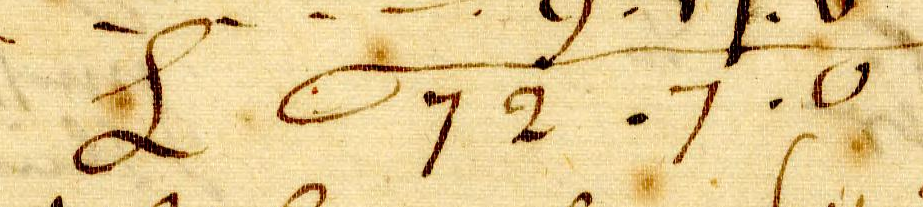£72.7.0
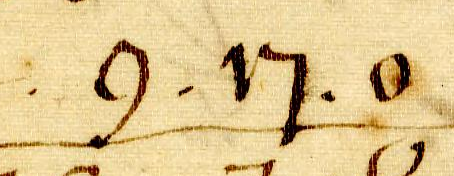9.17.0
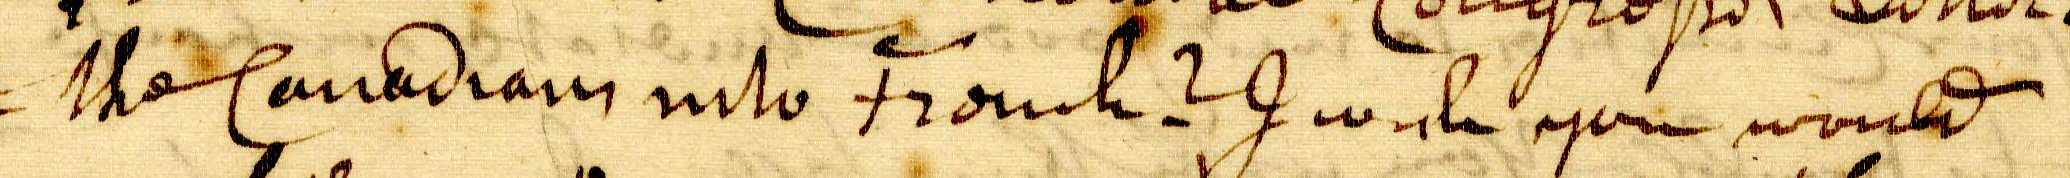the Canadians into French? I wish you would
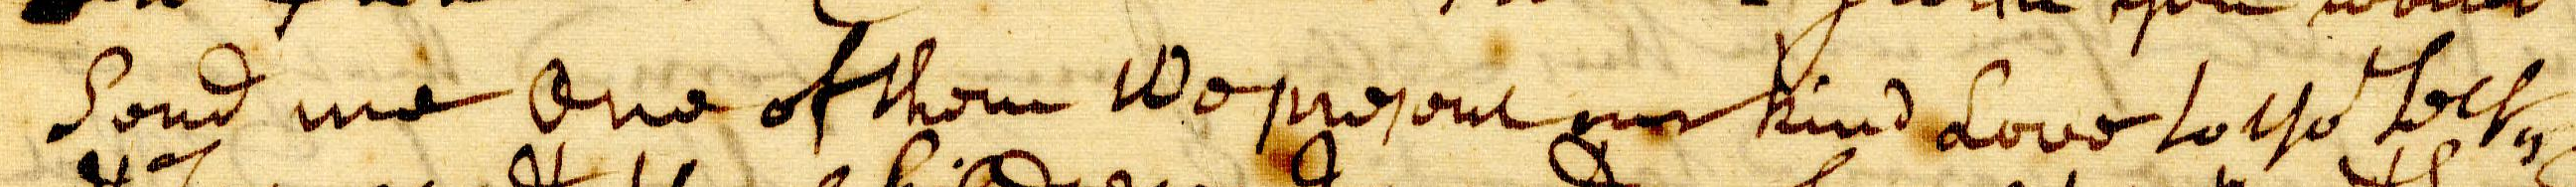Send me One of them We present our kind Love to Yo Self,
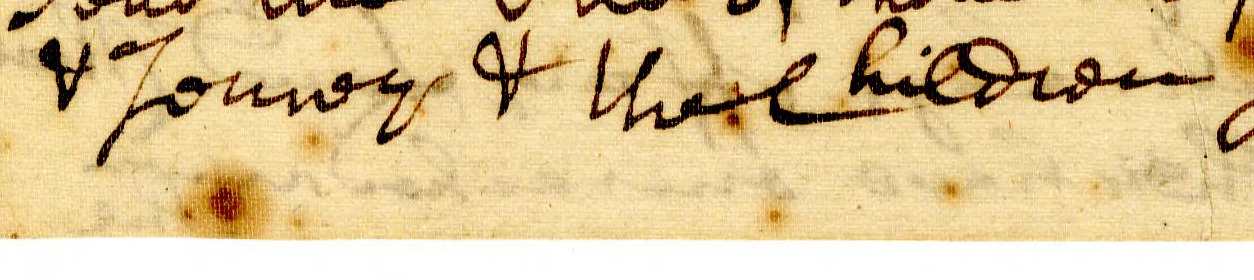& Jenny & the Children
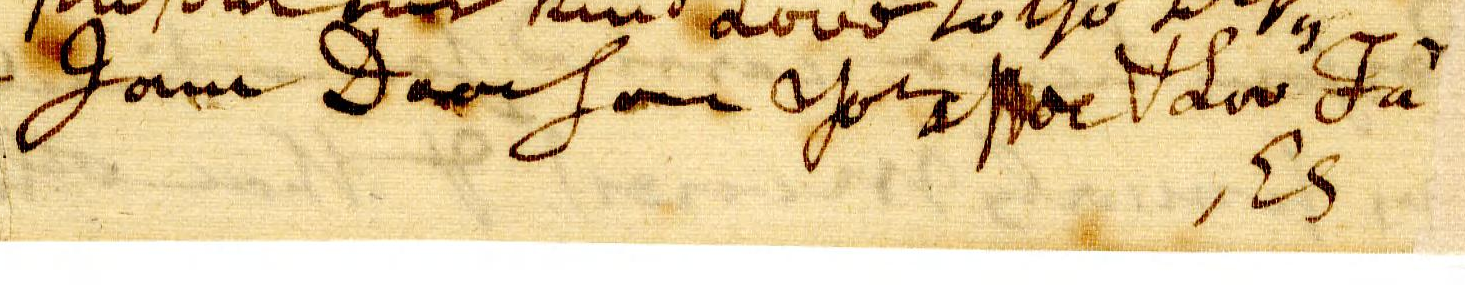I am Dear Son Your affec & Lov^g Fa^r
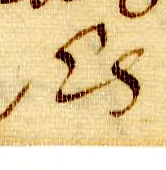ES
